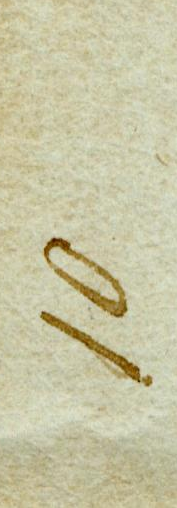10
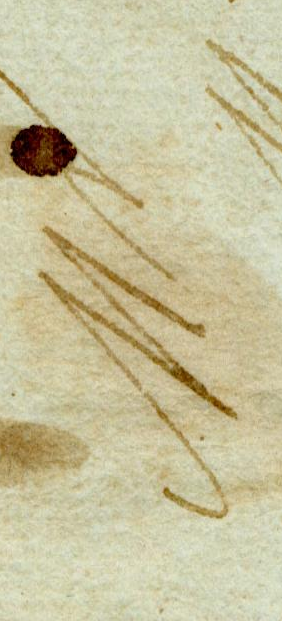M^r.
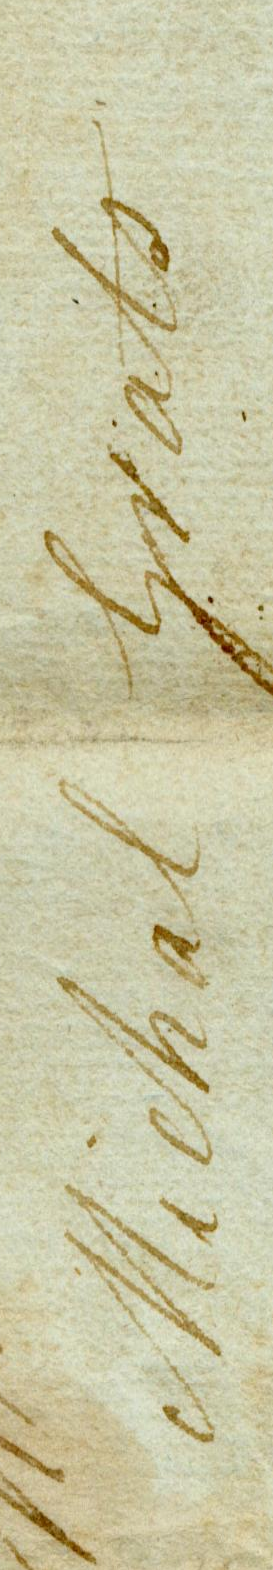Michal Grats
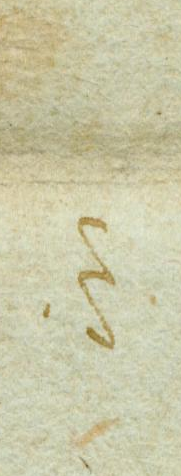in
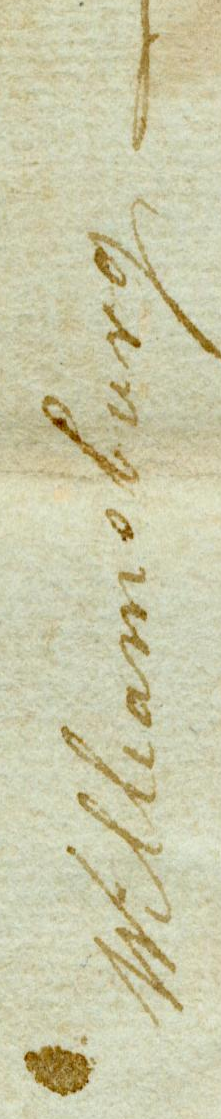Williamsburg
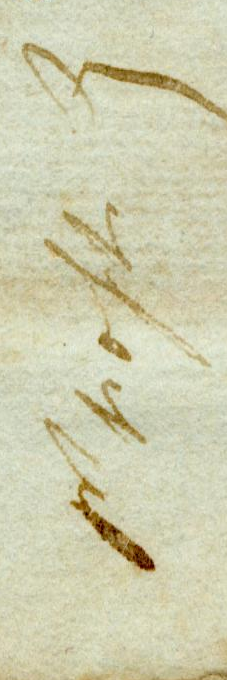p^r post
